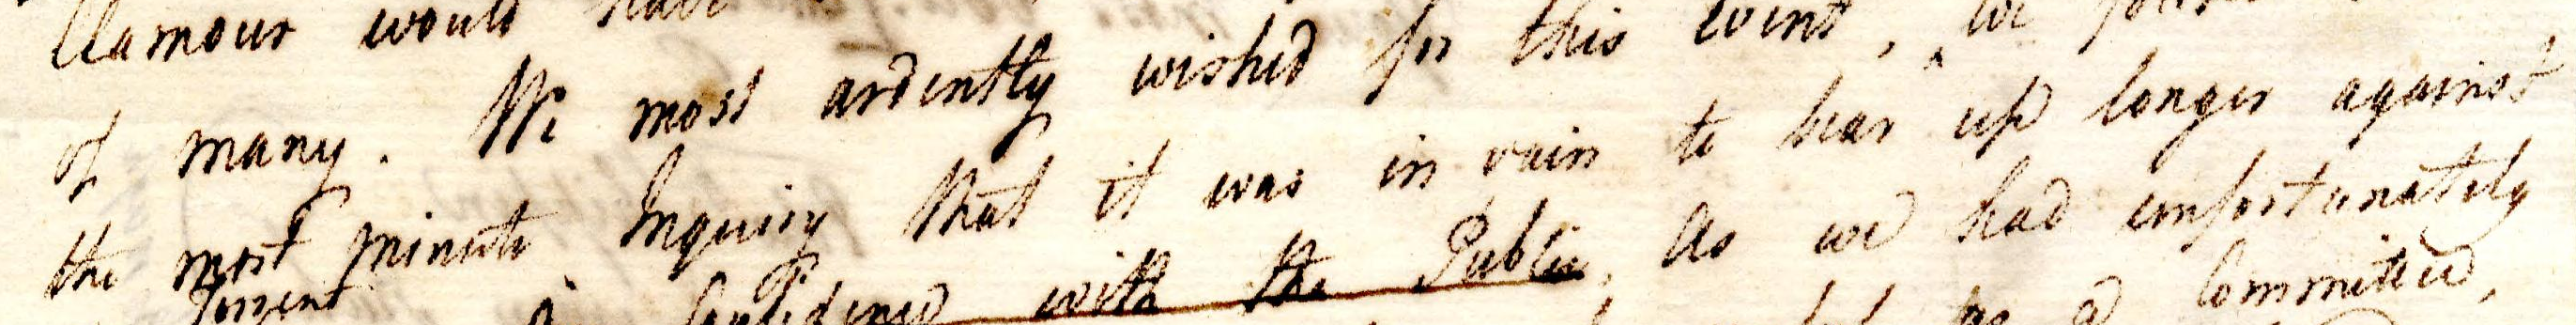the most minute Inquiry that it was in vain to bear up longer against
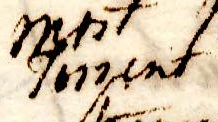Torment
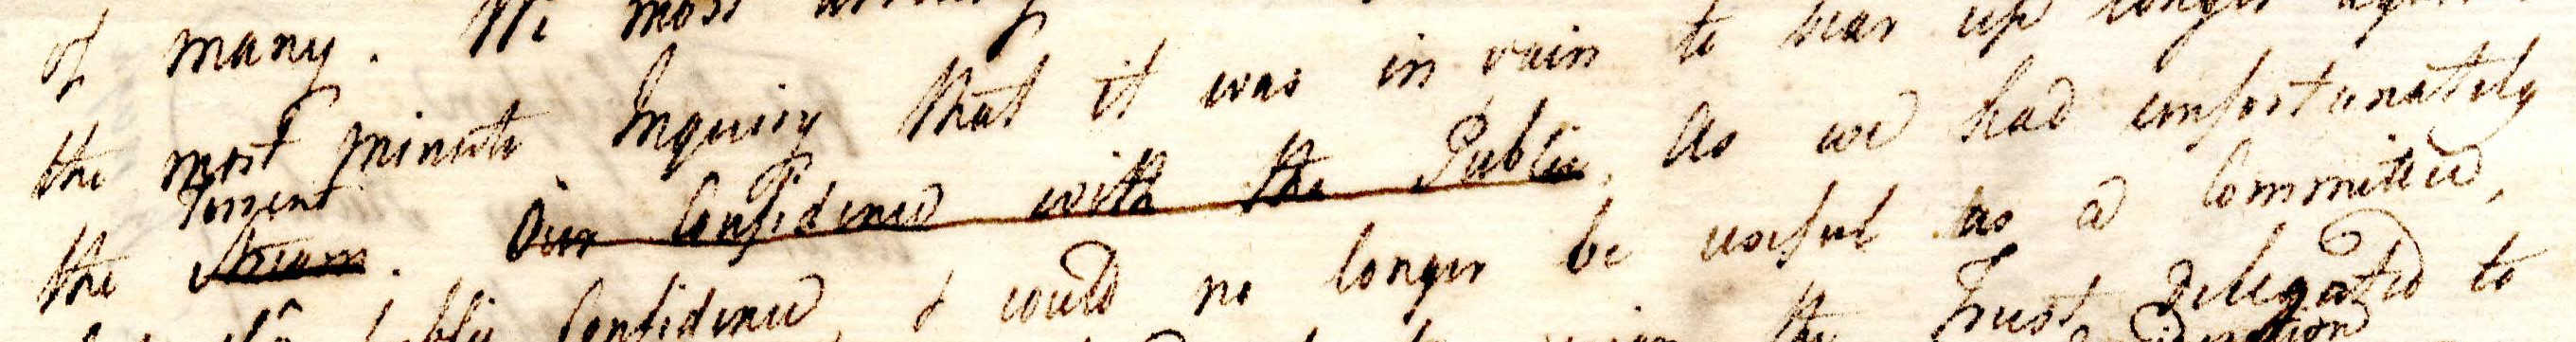the [Stream]. [Our Confidence with the Public], As we had unfortunately
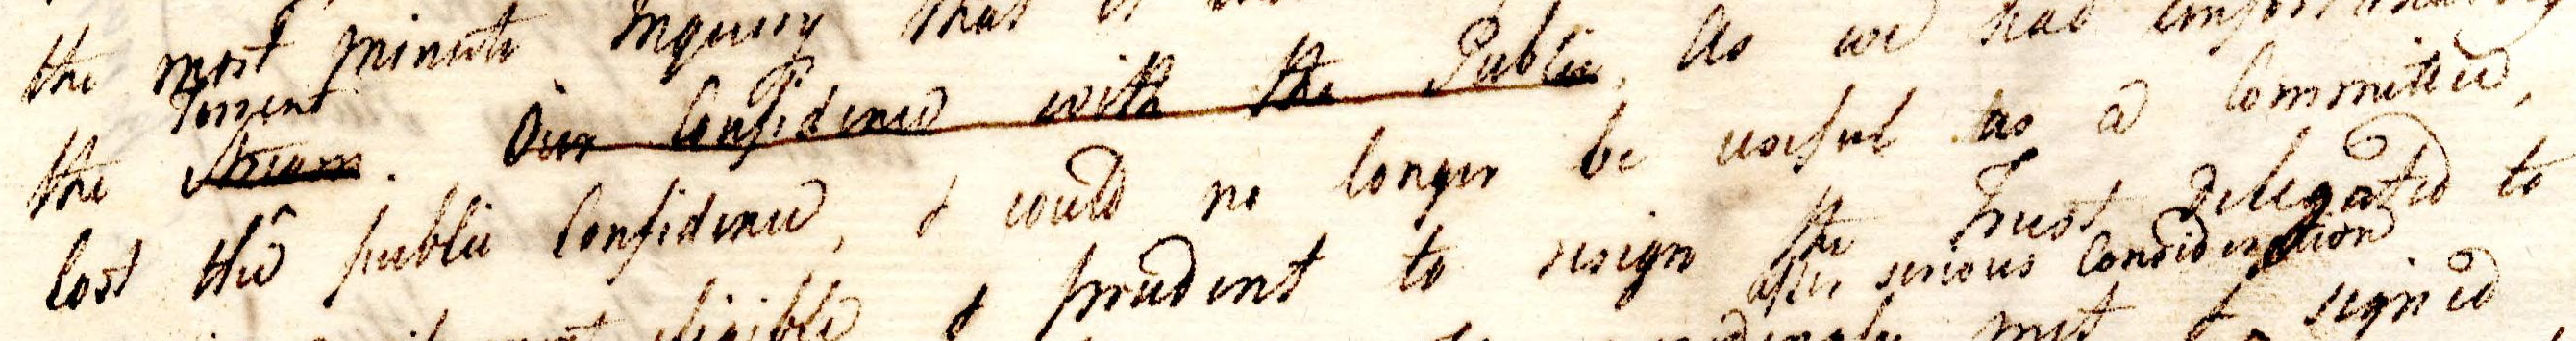lost the public Confidence, & could no longer be useful as a Committee,
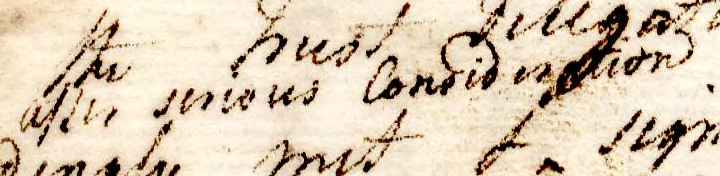after serious consideration
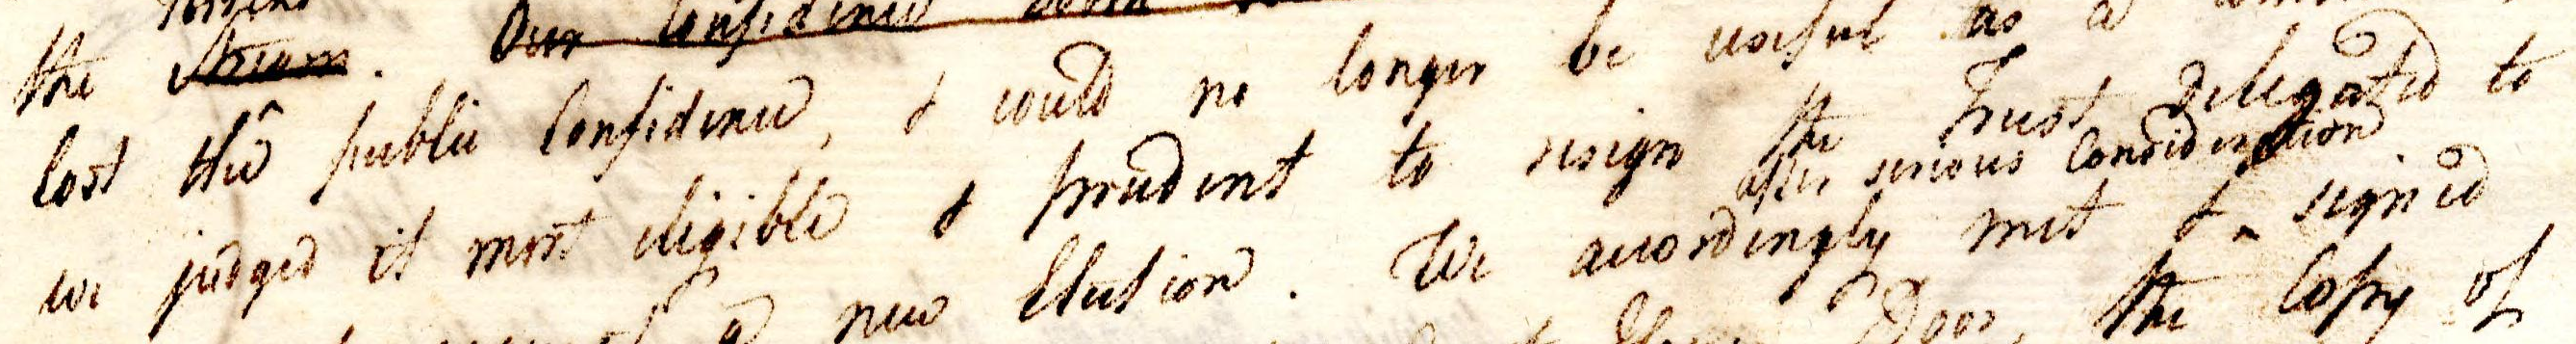we judged it most eligible & prudent to resign the Trust delegated to
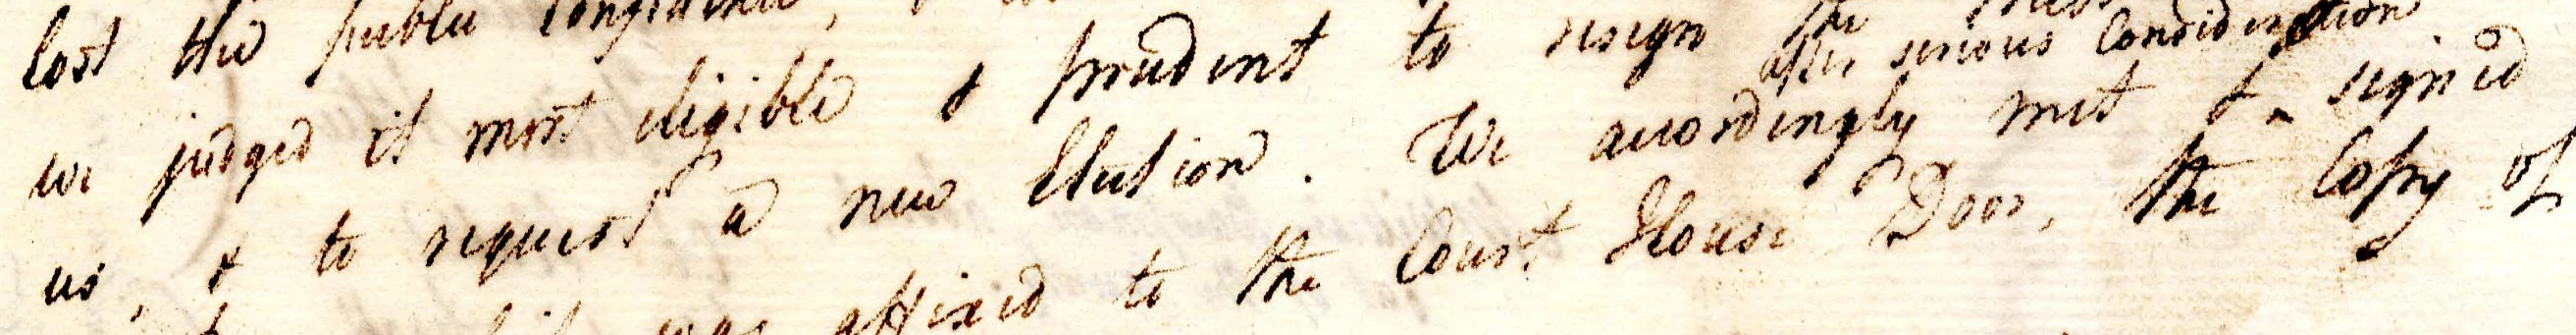us & to request a new Elusion. We accordingly met & ^ signed
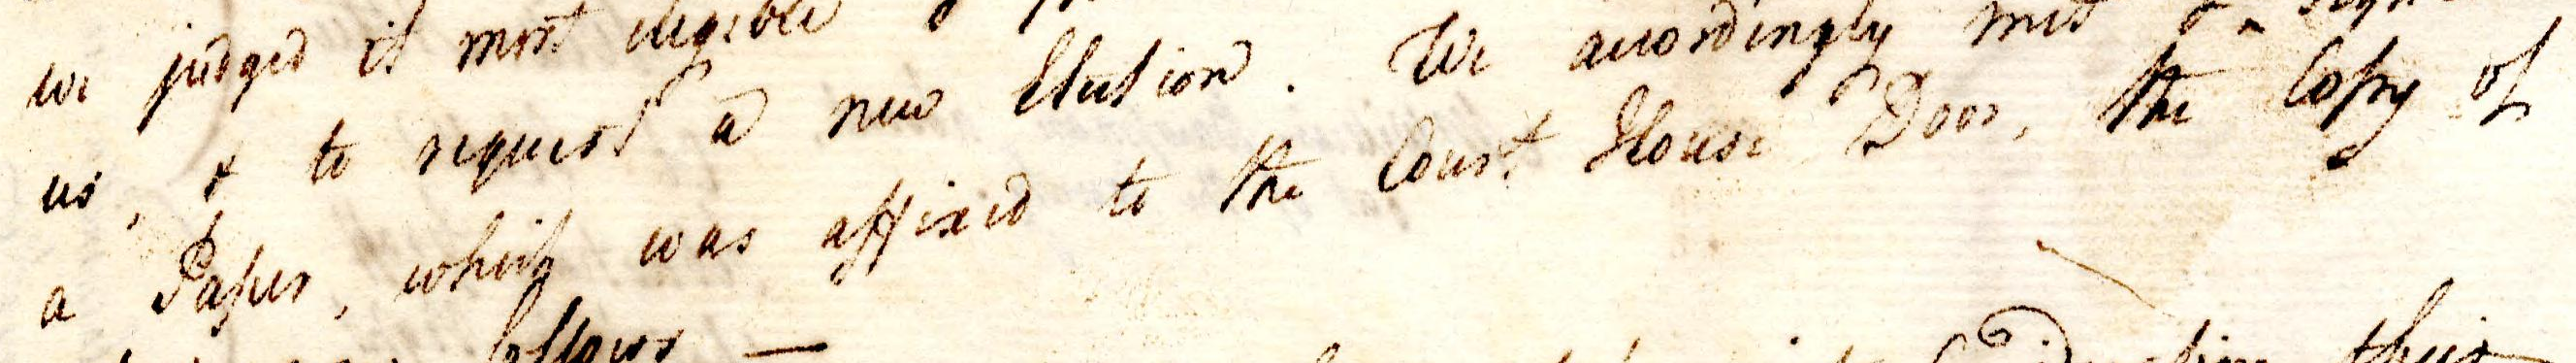a Paper, which was affixed to the Court House Door, the Copy of
